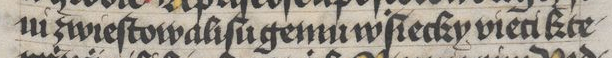ui zwieſtowaliſu gemu wẛiecky vieci kte¬
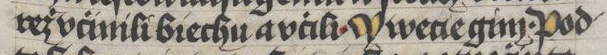reż vċinili bíechu a včili.Y wecie gim.Pod¬
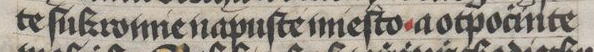te ſukromie napuſte mieſto.a otpoċinte
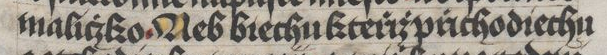malicżko.Neb biechu kteříż pṙichodíechu
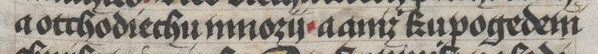a otchodíechu mnozij.a aniž ku pogedeni
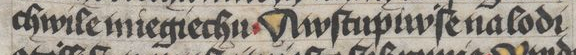chwíle miegíechu.A wſtupiwẛe na lodi
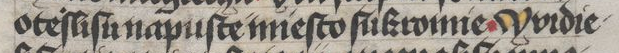oteẛliſu napuſté míeſto ſukromíe.Yvidie¬
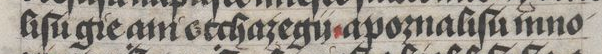li ſu gie ani otchazegij. a poznaliſu mno¬
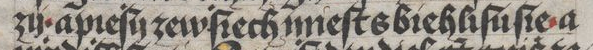zij. a pieẛij ze wẛiech mieſt sbiehli ſu ſie.a
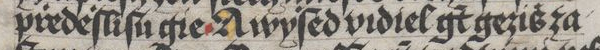pṙedeẛliſu gie.A wyẛed vidiel ḡt gezíš ža¬
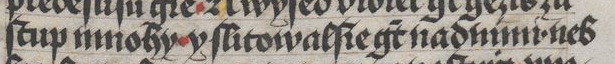ſtup mnohy.y ſlitouwal ſie ḡt nad nimi.neb
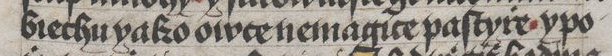biechu y ako owce nemagíce paſtyṙe.y po¬
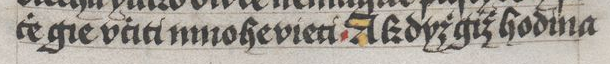ċe gie vċiti mnohe vieci. A kdyż giž hodina
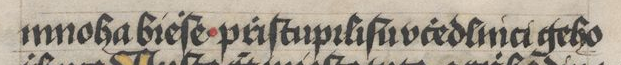mnoha bíeẛe.pṙiſtupili ſu vċedlnici geho
